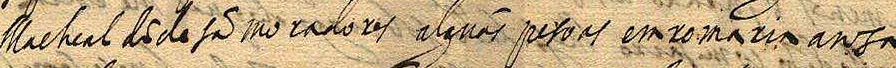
Macheal dōde sā moradores alguās pesoas em romaria a nosa
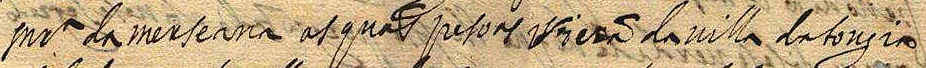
snra da merseana as quais pesoas vierā da uilla datougia
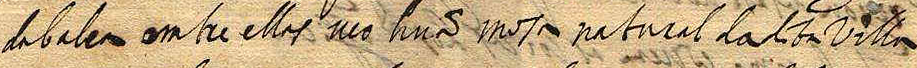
da balea emtre ellas ueo huā mosa natural da dita Villa
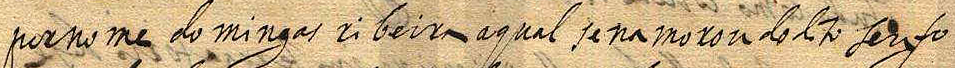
por nome domingas ribeira a qual se namorou do dito seu fo
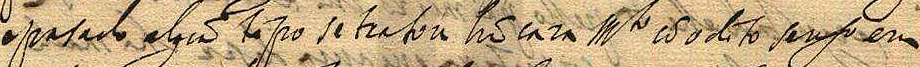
e pasado algū tēpo se tratou hū cazaMto cō o dito seu fo em
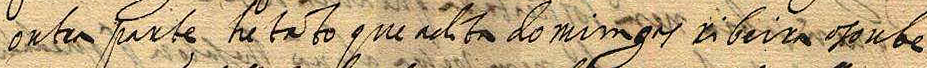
outra parte, he tāto que a dita domimgas ribeira o soube
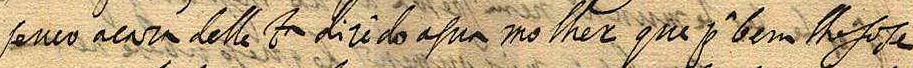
se ueo a caza delle ta dizēdo a sua molher que pa bem lhe fose
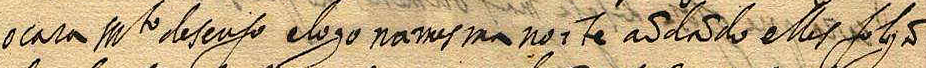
o cazaMto de seu fo e logo na mesma noite ādādo elles folgā
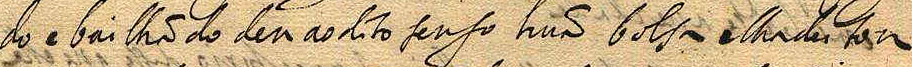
do e bailhādo deu ao dito seu fo huā bolsa e lha deitou
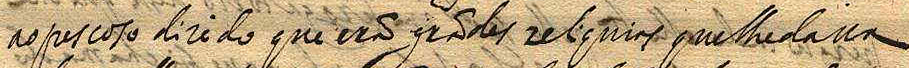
ao pescoso dizēdo que eraõ grādes reliquias que lhe daua
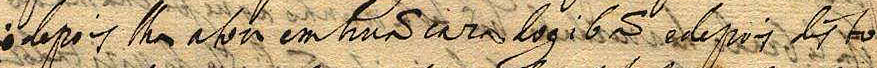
e depois lha atou em huā caza do gibā e depois disto
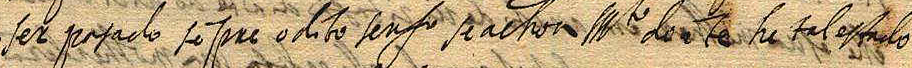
ser pasado sēpre o dito seu fo se achou Mto doēte he tal estado
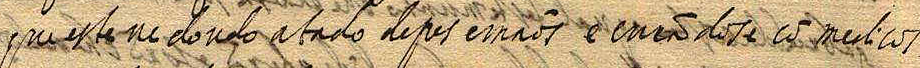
que esteue doudo atado de pes e maõs e curādose cō medicos
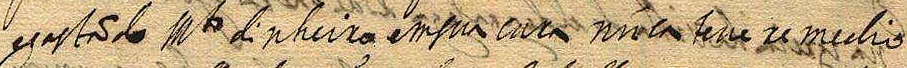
gastādo Mto dinheiro em sua cura nūca teue remedio
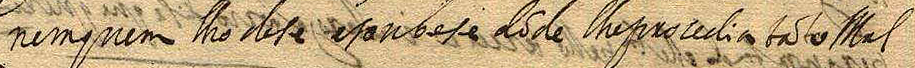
nem quem lho dese e soubese dōde lhe procedia tāto Mal
